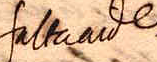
falta a ide
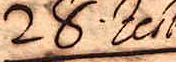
28. testa
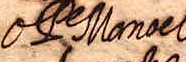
O Pe Manoel
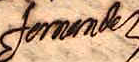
fernandez
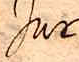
Jur
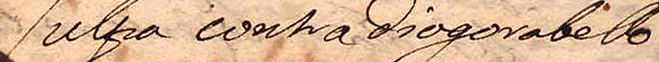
Culpa contra diogo rabello
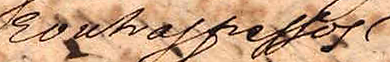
E outras pessos
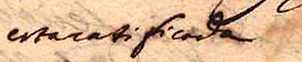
esta ratificada
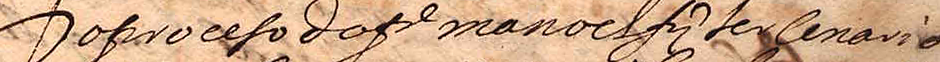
Do proceso do pe manoel frz̄ terCenario
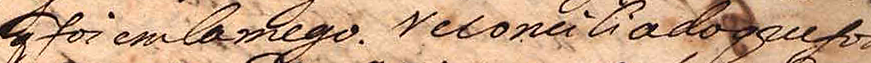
q̄ foi em lamego. reconciliado que foi
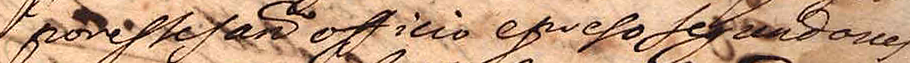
por esse santo officio e preso segunda ues
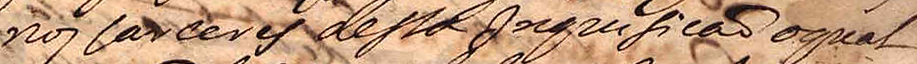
nos Carceres dessa Jnquisiçaõ o quaL
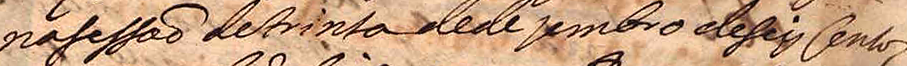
na sessaõ de trinta de dezembro de seisCentos
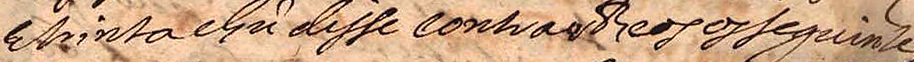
E trinta e hū disse contra os Reos os seguinte
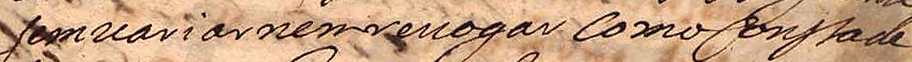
sem uariar nem reuogar como Consta de
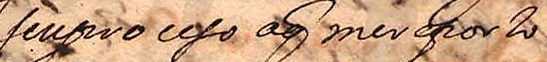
seu proceso a q̄ me reporto.
